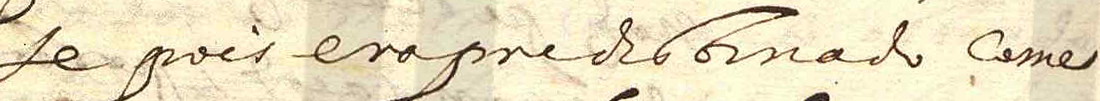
te pois era predestinado come
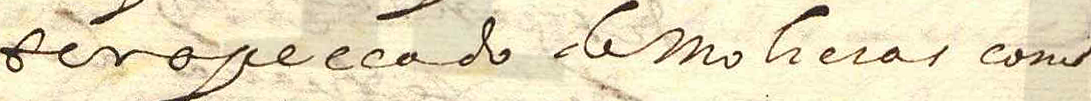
ter o peccado de molicias com
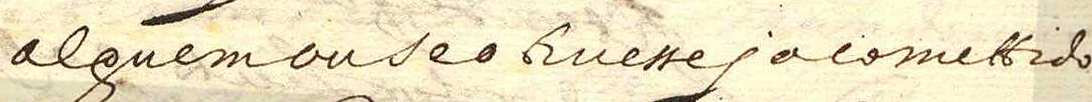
alguem ou se o tiuesse ja comettido
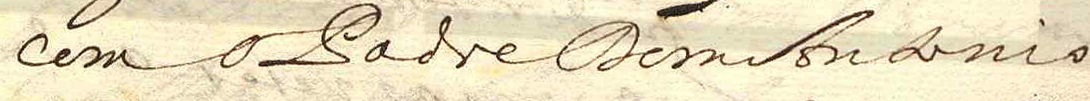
com o Padre Dom Antonio
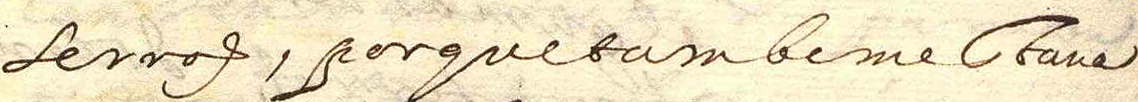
Serraõ, porque tambem estaua
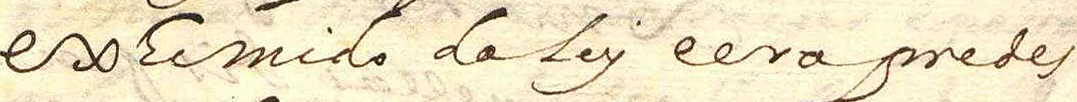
exhimido da Ley e era predes
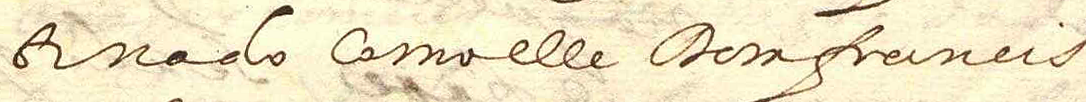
tinado como elle Dom francis
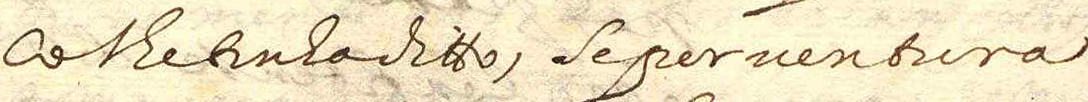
co lhe tinha ditto, se per uentura
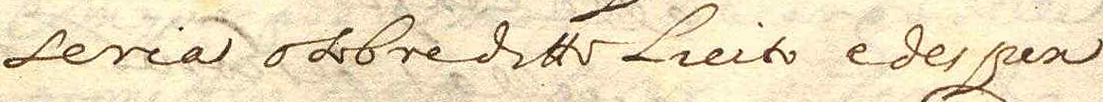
seria o sobreditto licito e despen
